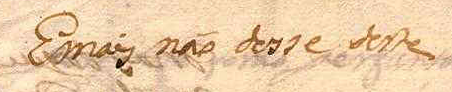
E mais naõ desse deste
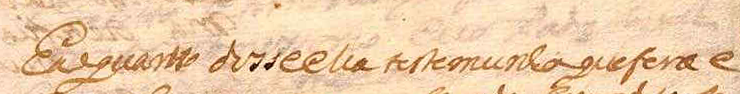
E ao quarto disse ella testemunha que fora e
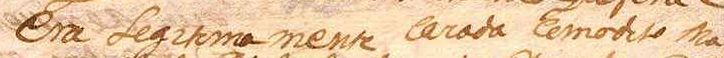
era Legitimamente cazada com o dito Ma
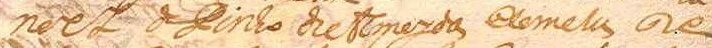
noeL de Pinho de Almeyda e com elle Re
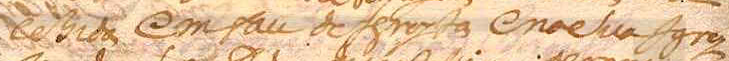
cebida Em face de Jgreyja, e na Sua Jgrej
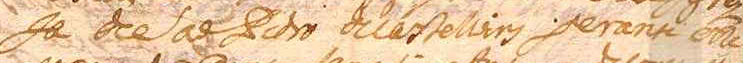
Ja de Saõ Pedro de castelloins perante o Re
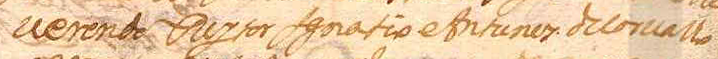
uerendo Reytor Ignasio Antunes de carualho
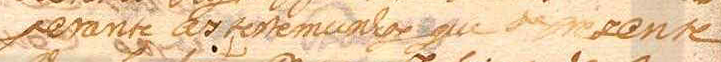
perante as testemunhas que de prezente
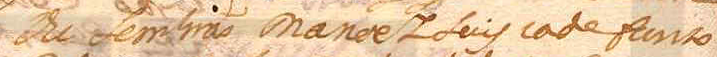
lhe Lembraõ ManoeL Luis ia defunto
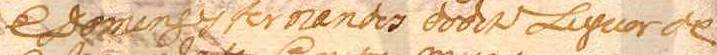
e Domingos fernandes do dito Luguar de
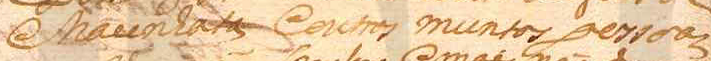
Macinhata e outras muntas pessoas
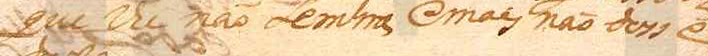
que lhe naõ Lembra E mais naõ disse
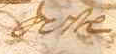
deste
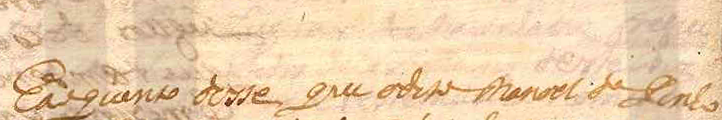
E ao quinto disse que o dito Manoel da Pinho
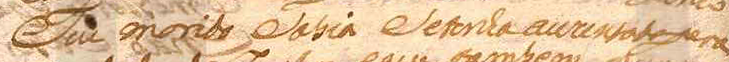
Seu marido sabia se tinha auzentado pera
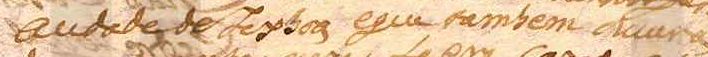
a cidade de Lixboa e que tambem ouuira
